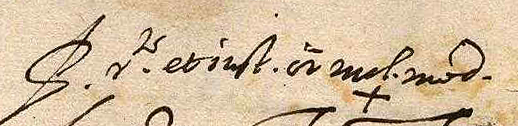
P. r.to et iust. or mel. mod.
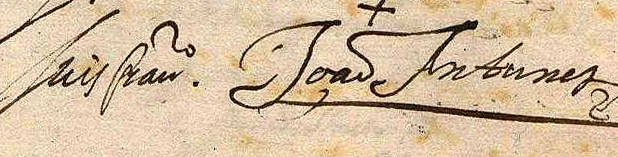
Luis Crau.ro Joaõ Antunes
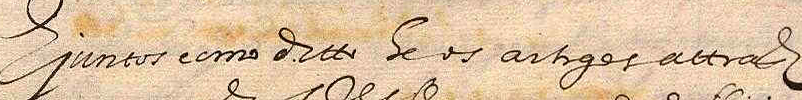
E juntos como ditto he os artigos attras
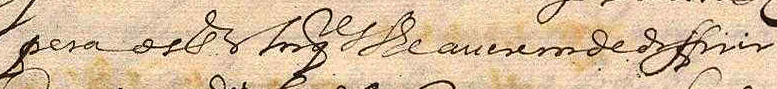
pera os ses Inqres lhe auerem de diffirir
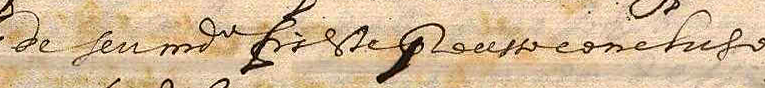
de seu mdo fis este processo concluso
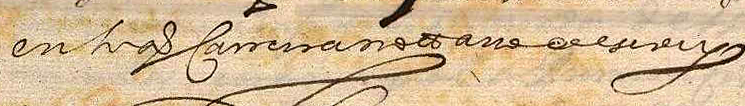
eu Ioaõ Carreira nottario o escreuj
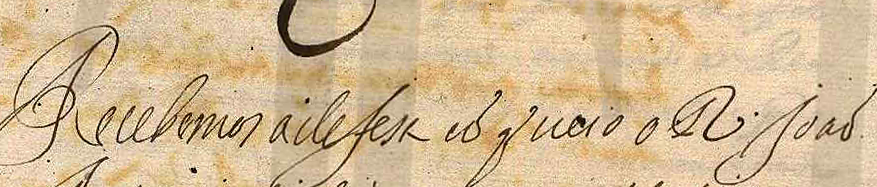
Recebemos a defesa cō q̄ ueio o R. Joaõ
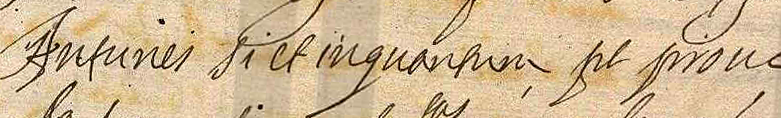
Antunes si et in quantum, pa proua
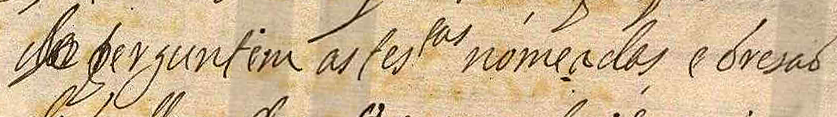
se perguntem as testas nomeadas, e ē resaõ
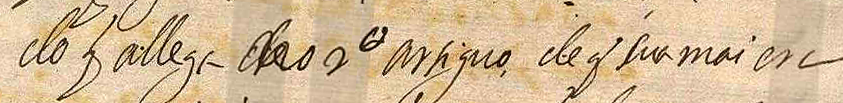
do q̄ allega no 2o artiguo, de q̄ sua mai era
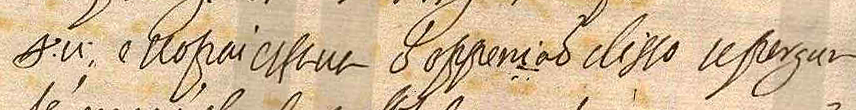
x. n., e seo pai estaua ē oppeniaõ disso se pergun
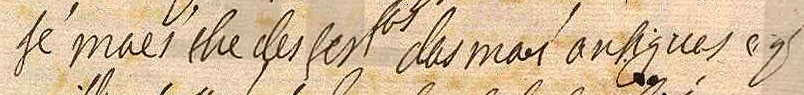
tē maes the des testas das mais antiguas e q̄
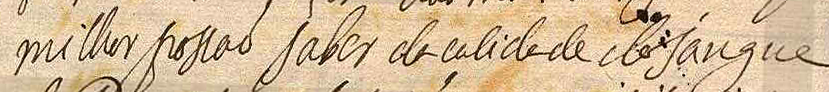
milhor possaõ saber da calidade do sangue
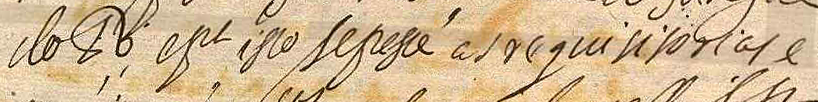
do R, e pa isso se passē as requisitorias e
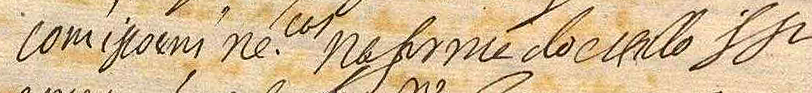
comissoens ne.cas na forma do estillo Lxa
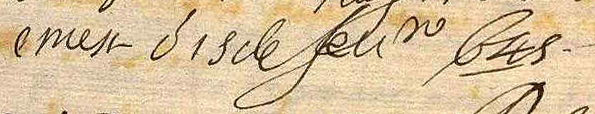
e mesa ē 15 de feuro 645.
